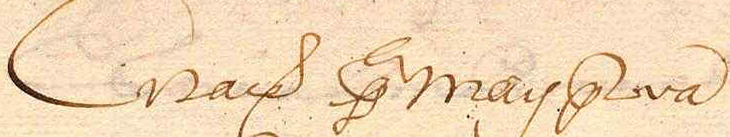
Citaçaõ p.a mais pRova
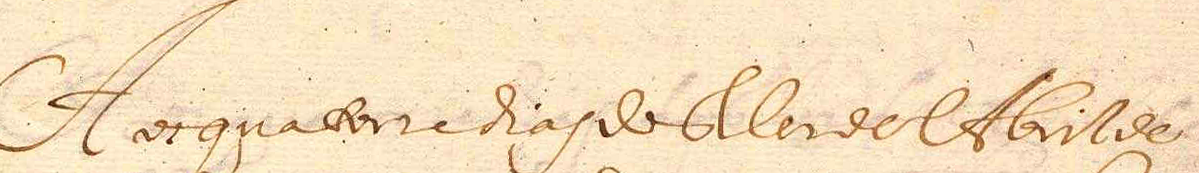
Aos quatorze dias do Mez de Abril de
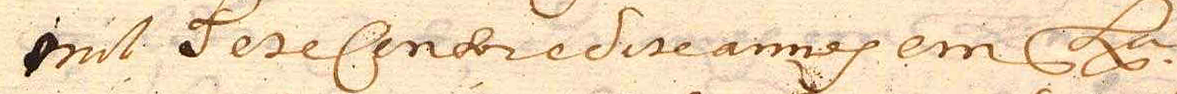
mil seteCentos e sete annos em L.xa
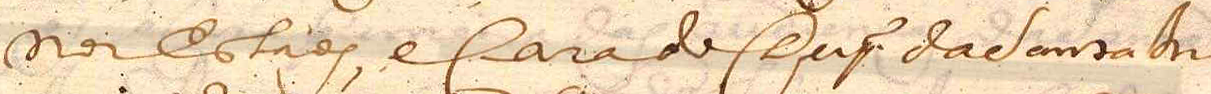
nos Estaos, e Caza do Desp.o da Santa In
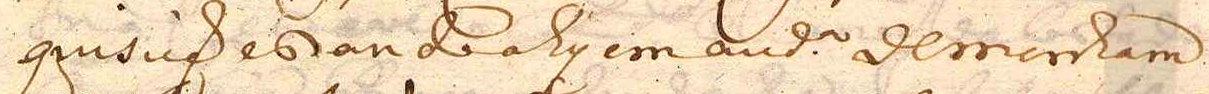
quisiçaõ estando ahy em aud.a de menham
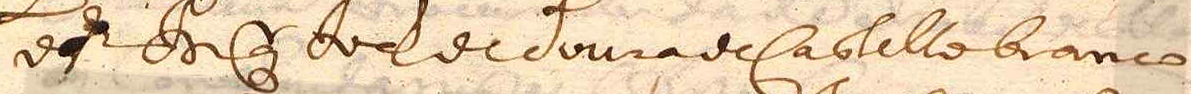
o s.r Inq.r Ioaõ de Souza de Castellobranco
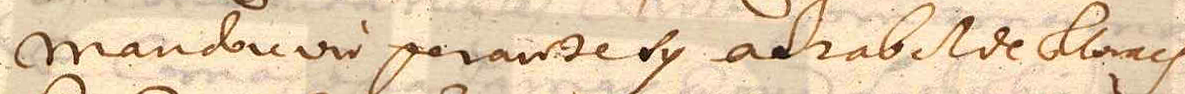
mandou vir perante sy a Izabel de Moraes
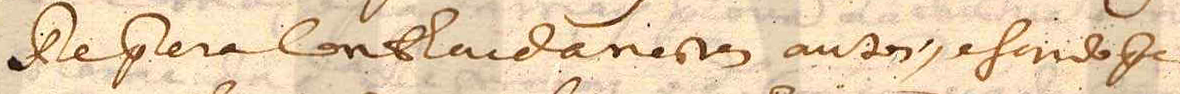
Re pReza Contheuda nestes autos, e sendo pRe
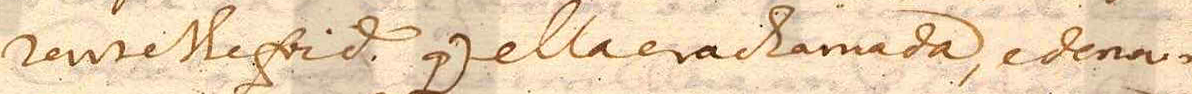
zente lhe foi d.o q̄ ella era chamada, e de novo
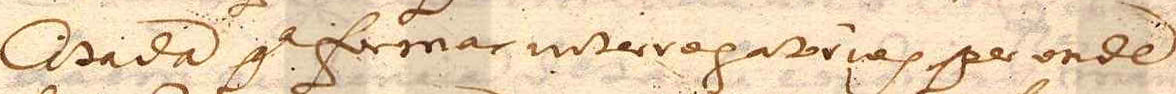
Citada p.a formar interrogatorias per onde
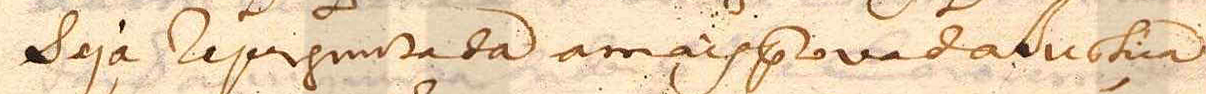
seja Reperguntada a mais pRova da Iustiça
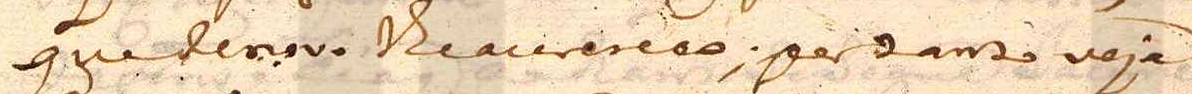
que de novo lhe acresceo; pertanto veja
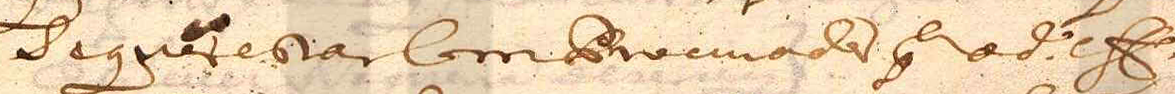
se quer estar Com Procurador p.a o d.o effo.
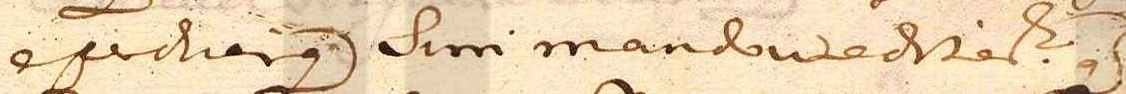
e pedia q̄ Sim mandou se dizer q̄
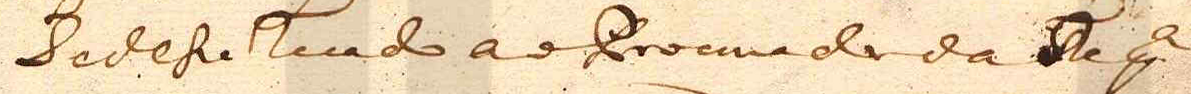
Se desse Recado ao Procurador da Re p.a
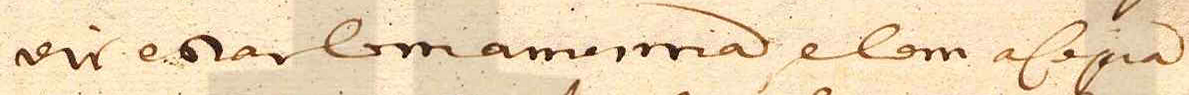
vir estar com a mesma, e com a Copia
